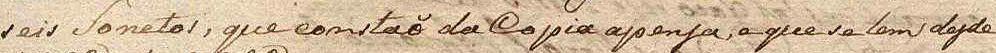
seis Sonetos, que constaõ da Copia apensa, e que se lem desde
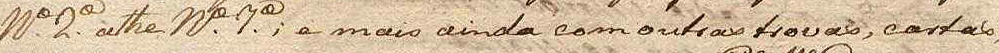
N.o 2.o athe N.o 7.o; e mais ainda com outras trovas, cartas,
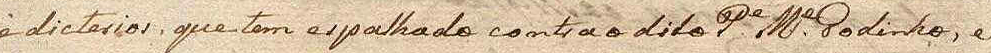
e dicterios, que tem espalhado contra o dito P. M.e Godinho, e
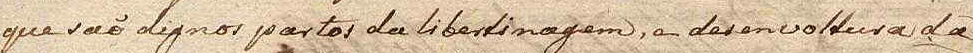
que saõ dignos partos da libertinagem, a desenvoltura da
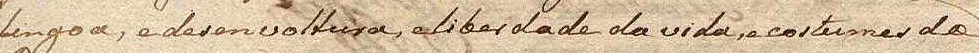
lingoa, e desenvoltura, e liberdade da vida, e costumes do
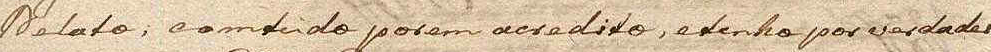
Delato; comtudo porem acredito, e tenho por verdadei
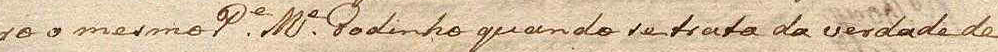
ro o mesmo P.e M.e Godinho quando se trata da verdade de
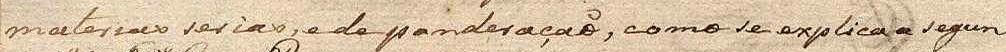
materias serias, e de ponderaçaõ, como se explica a segun
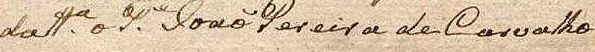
da tt.a o P.e Ioaõ Pereira de Carvalho.
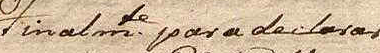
Finalm.te para declarar
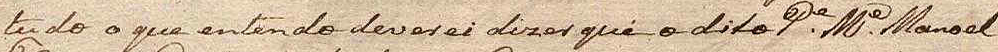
tudo o que entendo deverei dizer que o dito P.e M.e Manoel
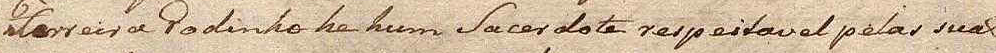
Ferreira Godinho he hum Sacerdote respeitavel pelas suas
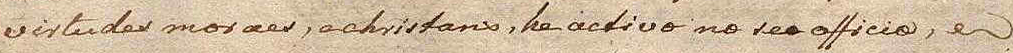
virtudes moraes, e christans, he activo no seo officio, e
